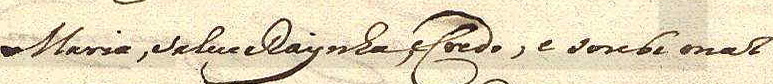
Maria, salue Raynha, e Credo, e soube mal
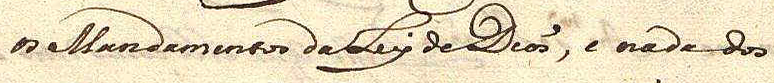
os Mandamentos da Ley de Deos̄, e nada dos
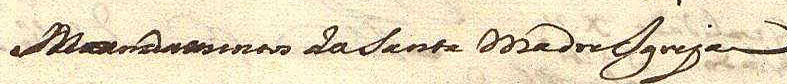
Mandamentos da Santa Madre Igreja
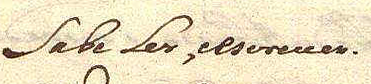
Sabe ler, e escreuer.
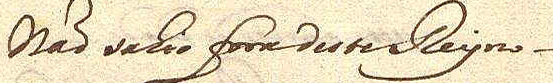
Naõ sahio fora deste Reyno ‒
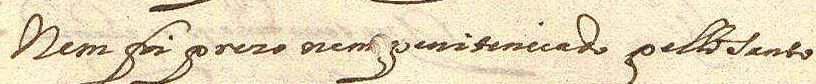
Nem foi prezo nem penitenciado pello santo
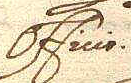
Officio.
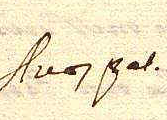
Auos pat.
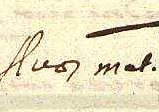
Auos mat.
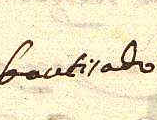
bautisado
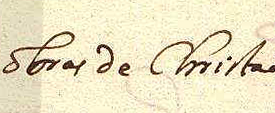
obras de Christaõ
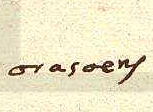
orasoens
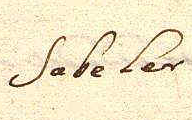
Sabe Ler
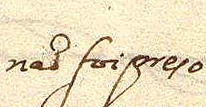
naõ foi preso
